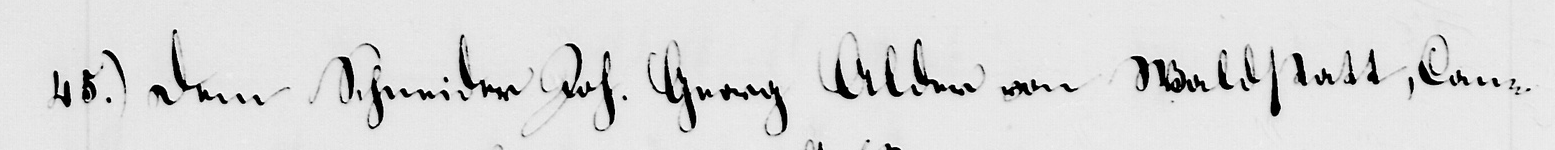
45.) dem Schneider Joh. Georg Alder von Waldstatt, Can¬
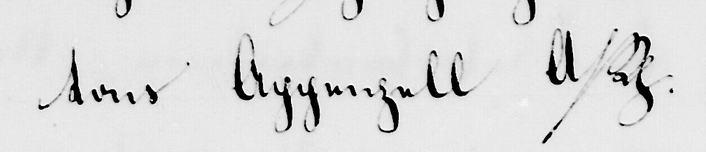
tons Appenzell A/R.
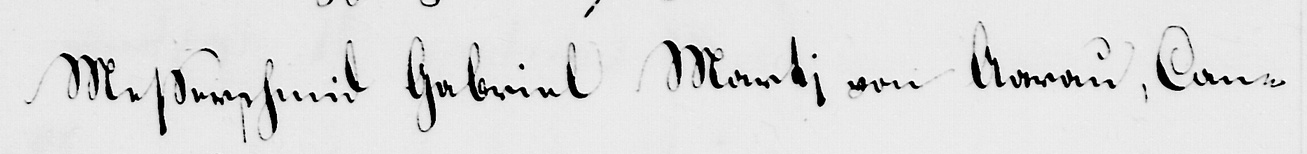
eßerschmid Gabriel Marti von Aarau, Can¬
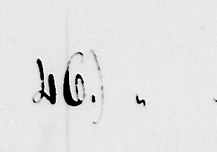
46.)
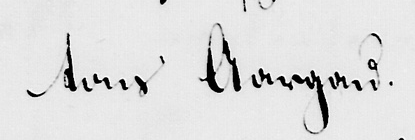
tons Aargau.
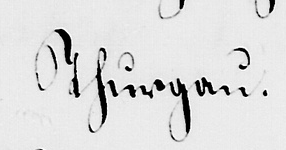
Thurgau.
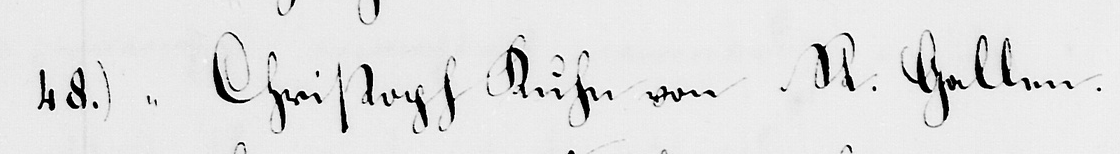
48.) " Christoph Kuhn von St. Gallen.
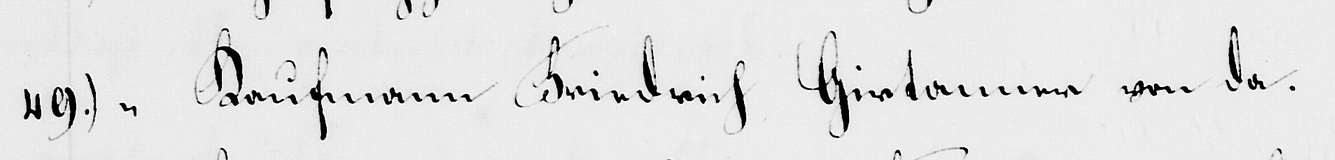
49.) " Kaufmann Friedrich Girtanner von da.
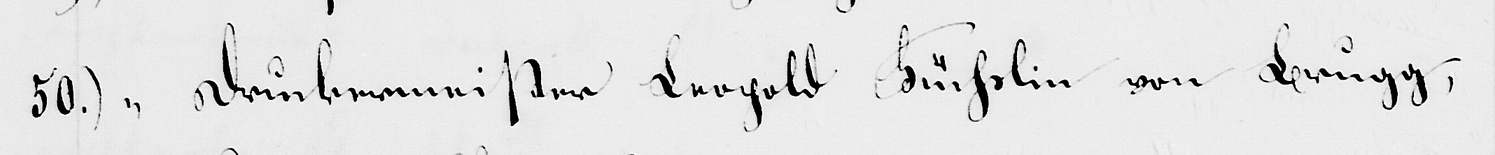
50.) " Druckermeister Leopold Füchslin von Brugg,
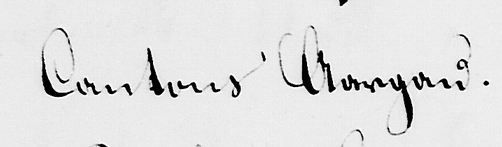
Cantons Aargau.
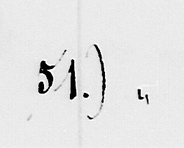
51.)
